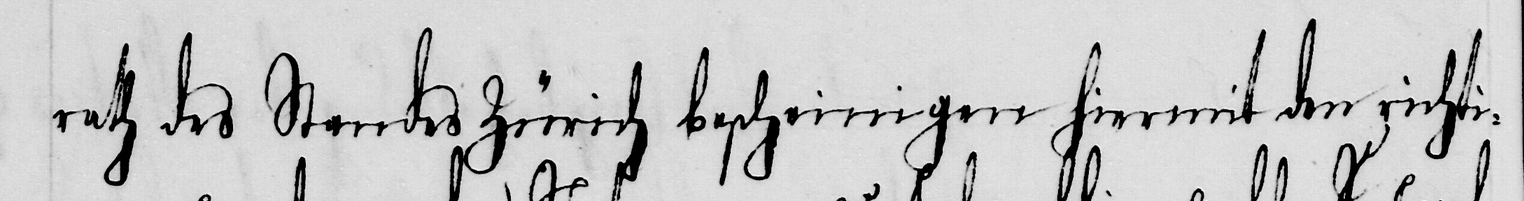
rath des Standes Zürich bescheinigen hiermit den richti¬
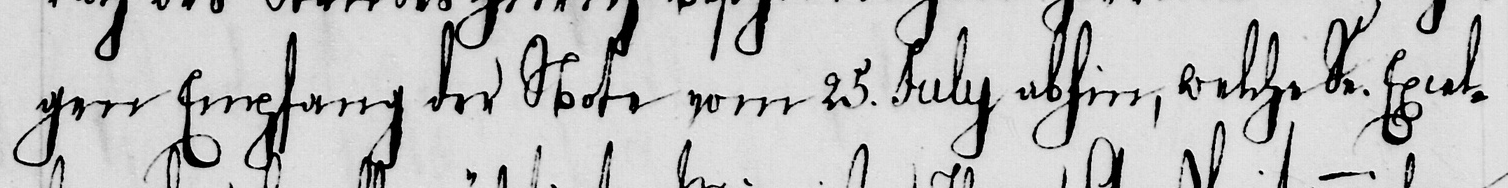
gen Empfang der Note vom 25. July abhin, welche Se. Exce¬
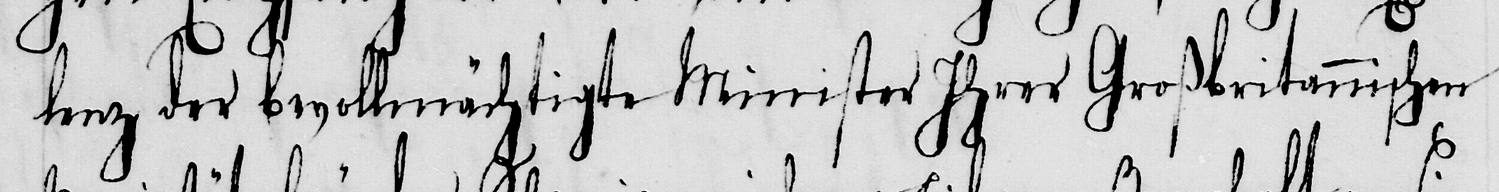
lenz der bevollmächtigte Minister Ihrer Großbritannischen
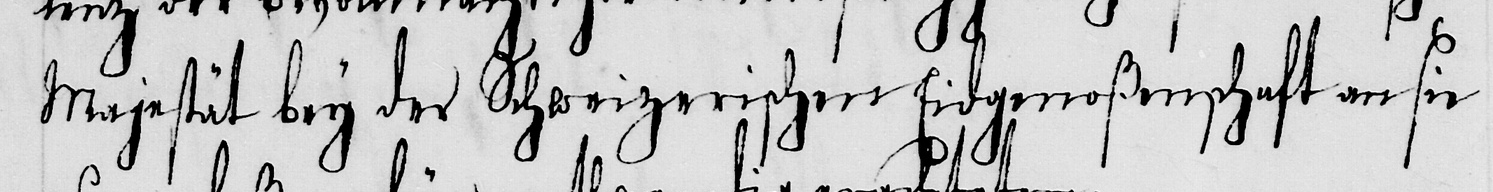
Majestät bey der Schweizerischen Eidgenoßenschaft an sie
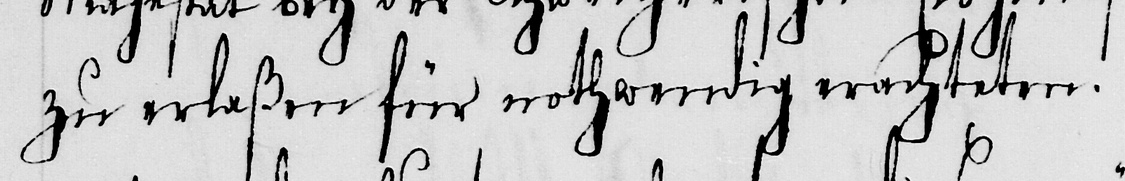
zu erlaßen für nothwendig erachteten.
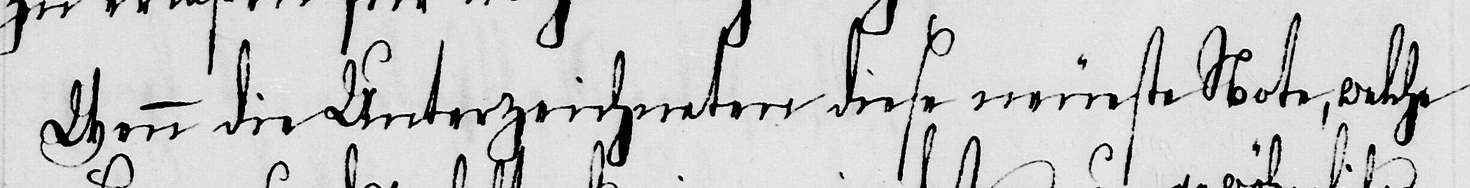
Wenn die Unterzeichneten diese neueste Note, welche
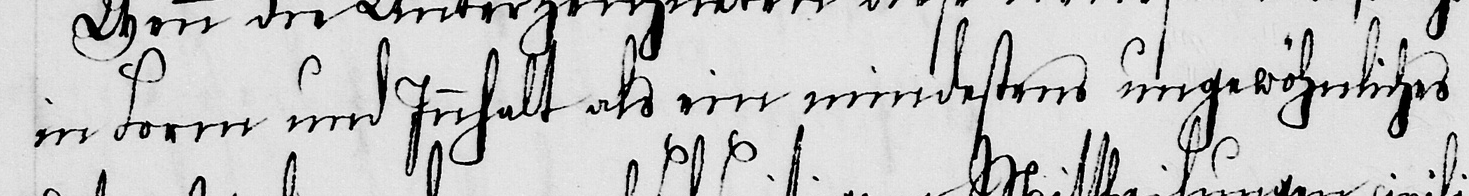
in Form und Inhalt als ein mindestens ungewöhnliches
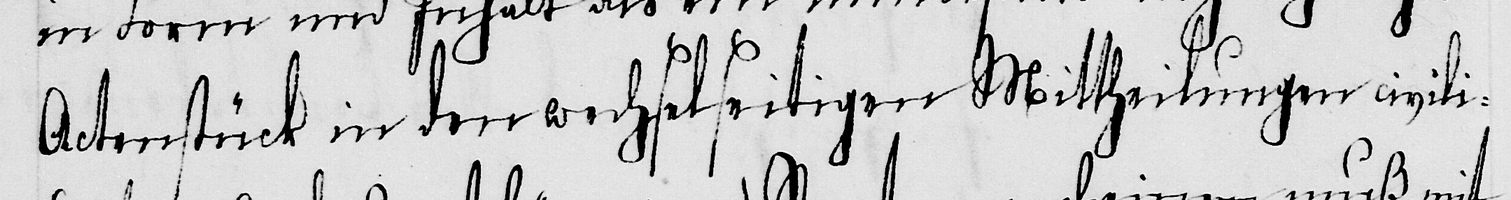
Actenstück in den wechselseitigen Mittheilungen civili¬
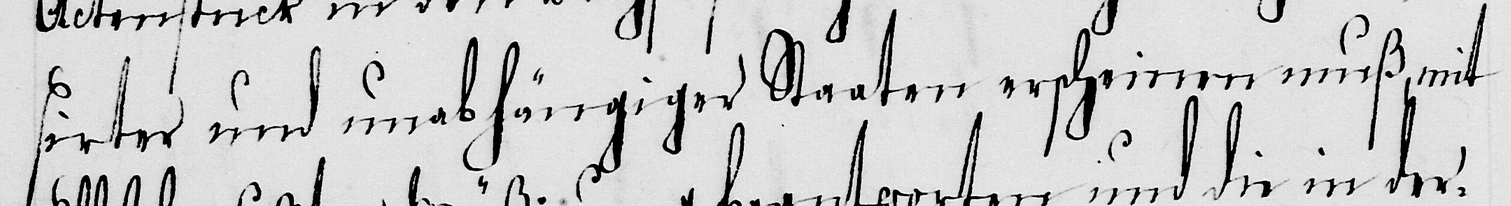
sirter und unabhängiger Staaten erscheinen muß, mit
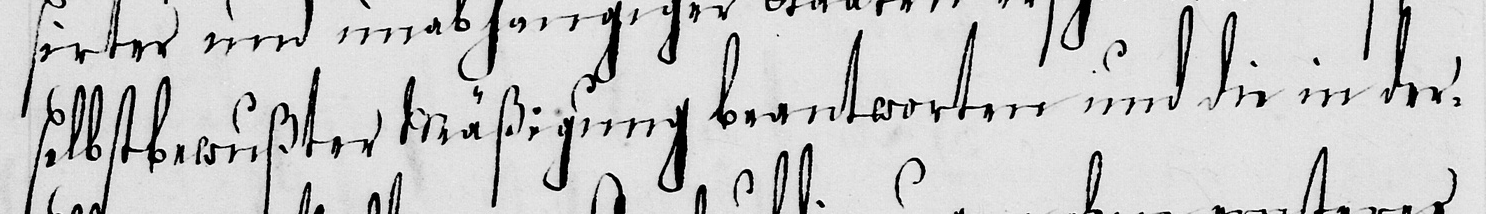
selbstbewußter Mäßigung beantworten und die in der¬
